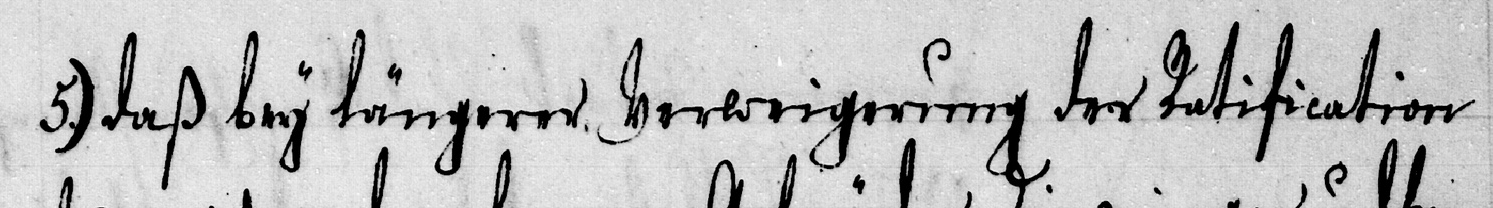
5.) daß bey längerer Verweigerung der Ratification
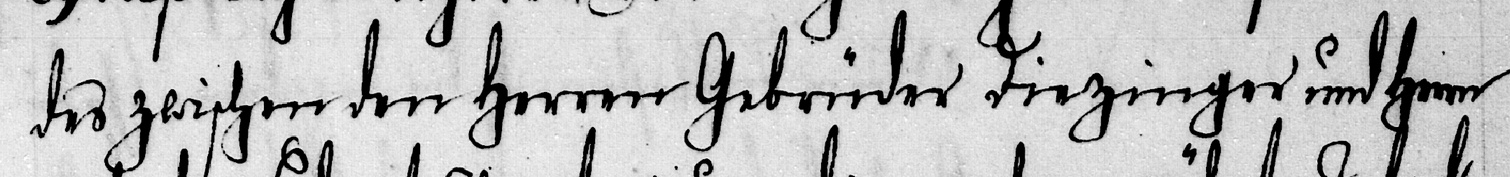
des zwischen den Herrn Gebrüder Diezinger und Herrn
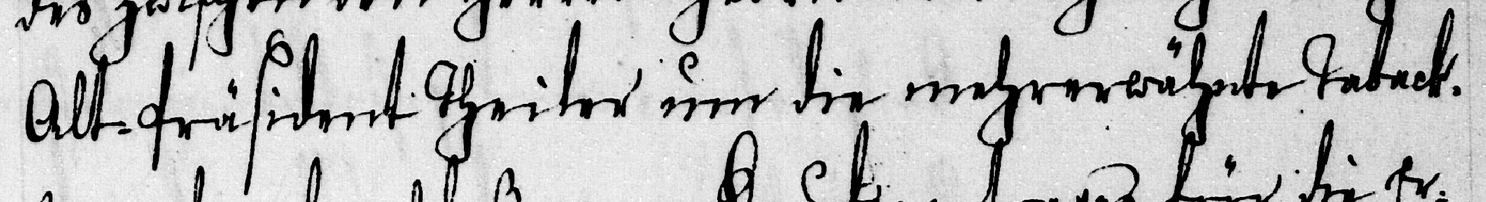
Alt-Präsident Theiler um die mehrerwähnte Taback¬
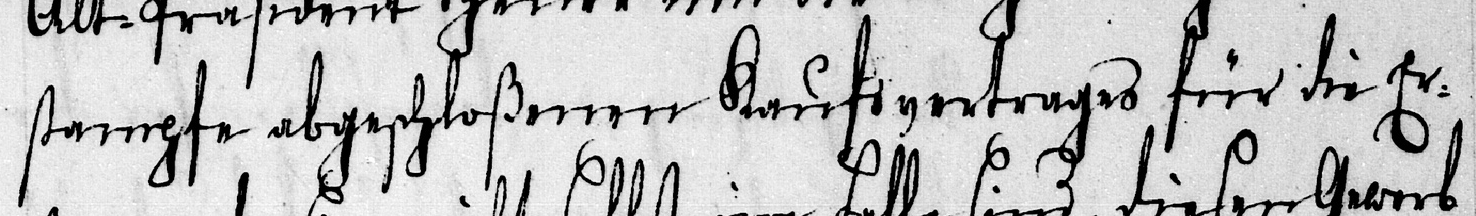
stampfe abgeschloßenen Kaufvertrages für die Er¬
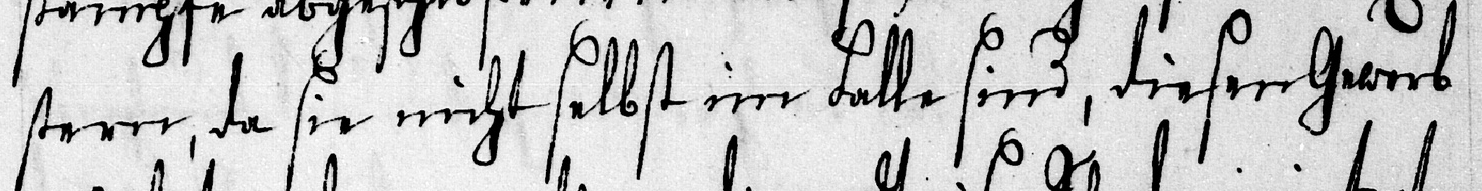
stern, da sie nicht selbst im Falle sind, diesen Gewerb
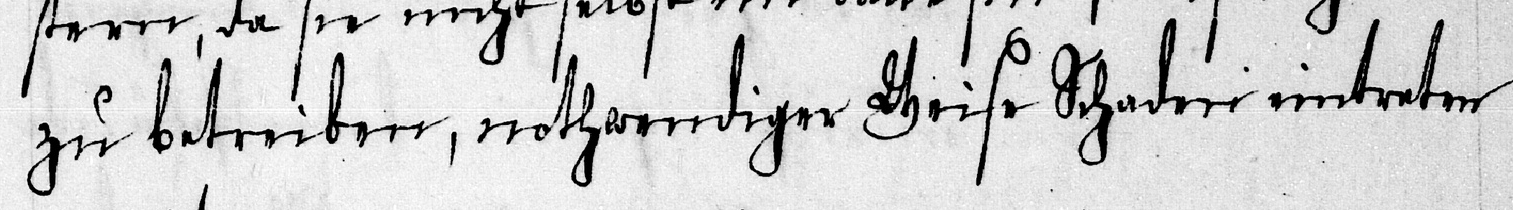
zu betreiben, nothwendiger Weise Schaden eintreten
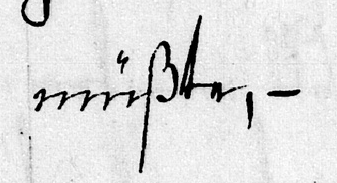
müßte, –
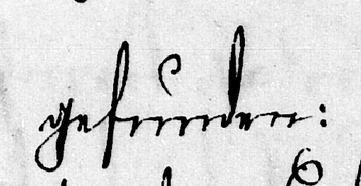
gefunden:
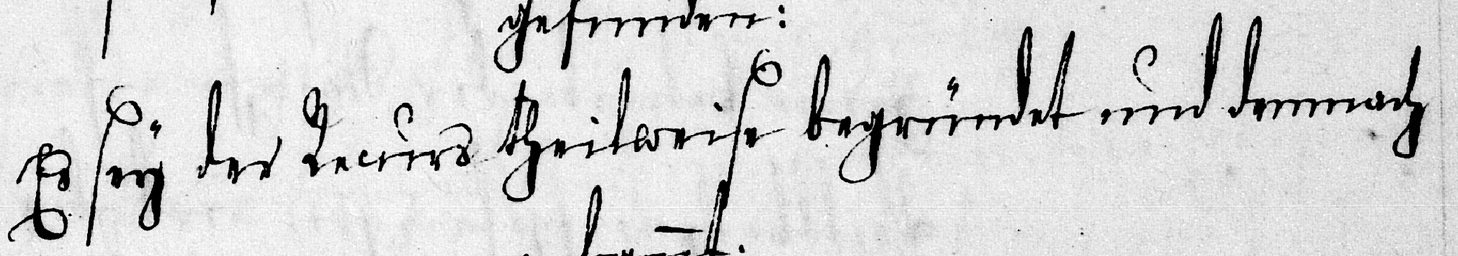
Es sey der Recurs theilweise begründet und demnach
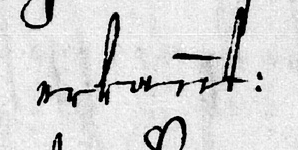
erkannt:
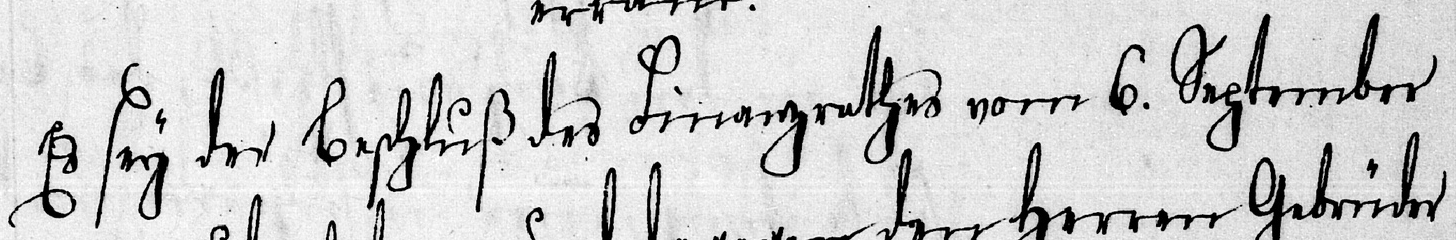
Es sey der Beschluß des Finanzrathes vom 6. September
